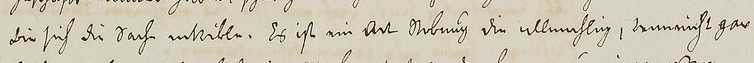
wie sich die Lage entwikle. Es ist eine Art Stokung die allmählig, wenn nicht gar
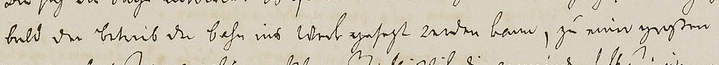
bald der Betrieb der Bahn ins Werk gesezt werden kann, zu einer großen
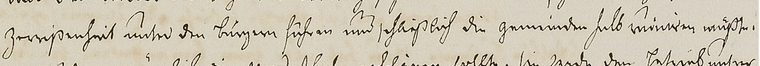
Zerrißenheit unter den Bürgern führen und schließlich die Gemeinde halb ruiniren müßte.
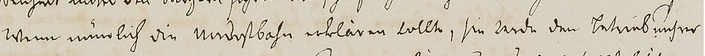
Wenn nämlich die Nordostbahn erklären wollte, sie werde den Betrieb unsrer
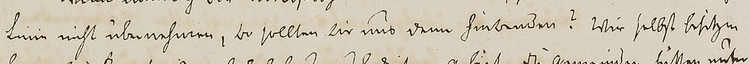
Linie nicht übernehmen, wo sollten wir uns denn hinwenden? Wir selbst besitzen
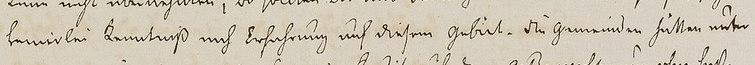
keinerlei Kenntniß noch Erfahrung auf diesem Gebiet. Die Gemeinden hätten unter
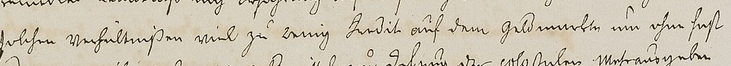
solchen Verhältnißen viel zu wenig Kredit auf dem Geldmarkte um ohne fast
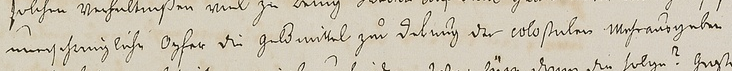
unerschwingliche Opfer die Geldmittel zur Dekung der coloßalen Mehrausgaben
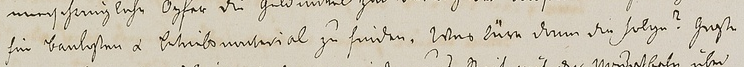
für Baukosten & Betriebsmaterial zu finden. Was wäre dann die Folge? Große
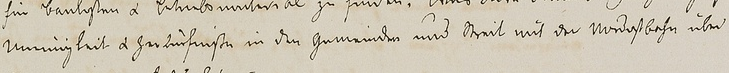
Uneinigkeit & Zerwürfniße in den Gemeinden und Streit mit der Nordostbahn über
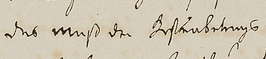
das Maß des Kostenbetrags.
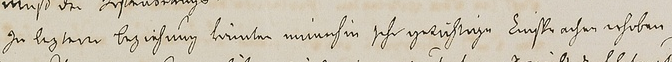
In letzterer Beziehung könnten immerhin sehr gewichtige Einsprachen erhoben
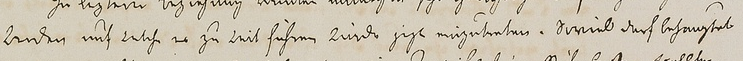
werden auf welche es zu weit führen würde jezt einzutreten. Soviel darf behauptet
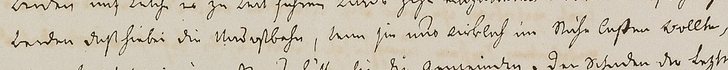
werden daß hiebei die Nordostbahn, wenn sie uns wirklich im Stiche laßen wollte,
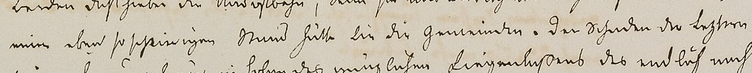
einen eben so schwierigen Stand hätte wie die Gemeinden. Der Schaden der Leztern
